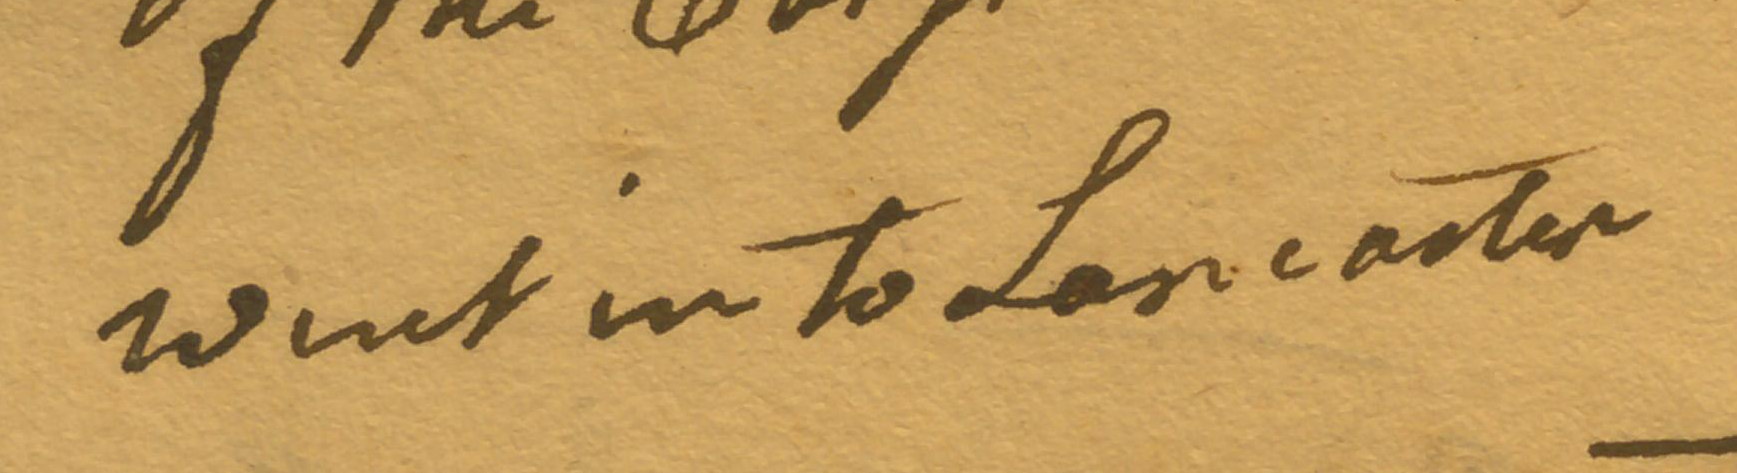went in to Lancaster
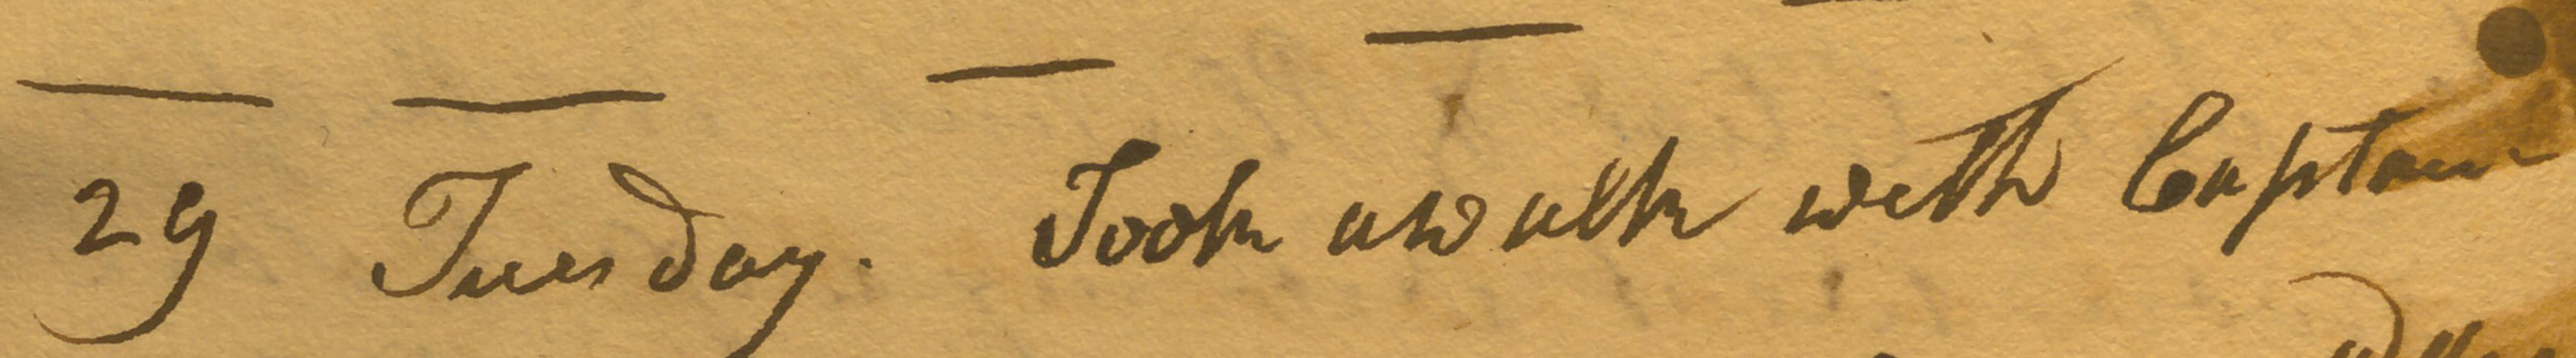29 Tuesday. Took a walk with Captain
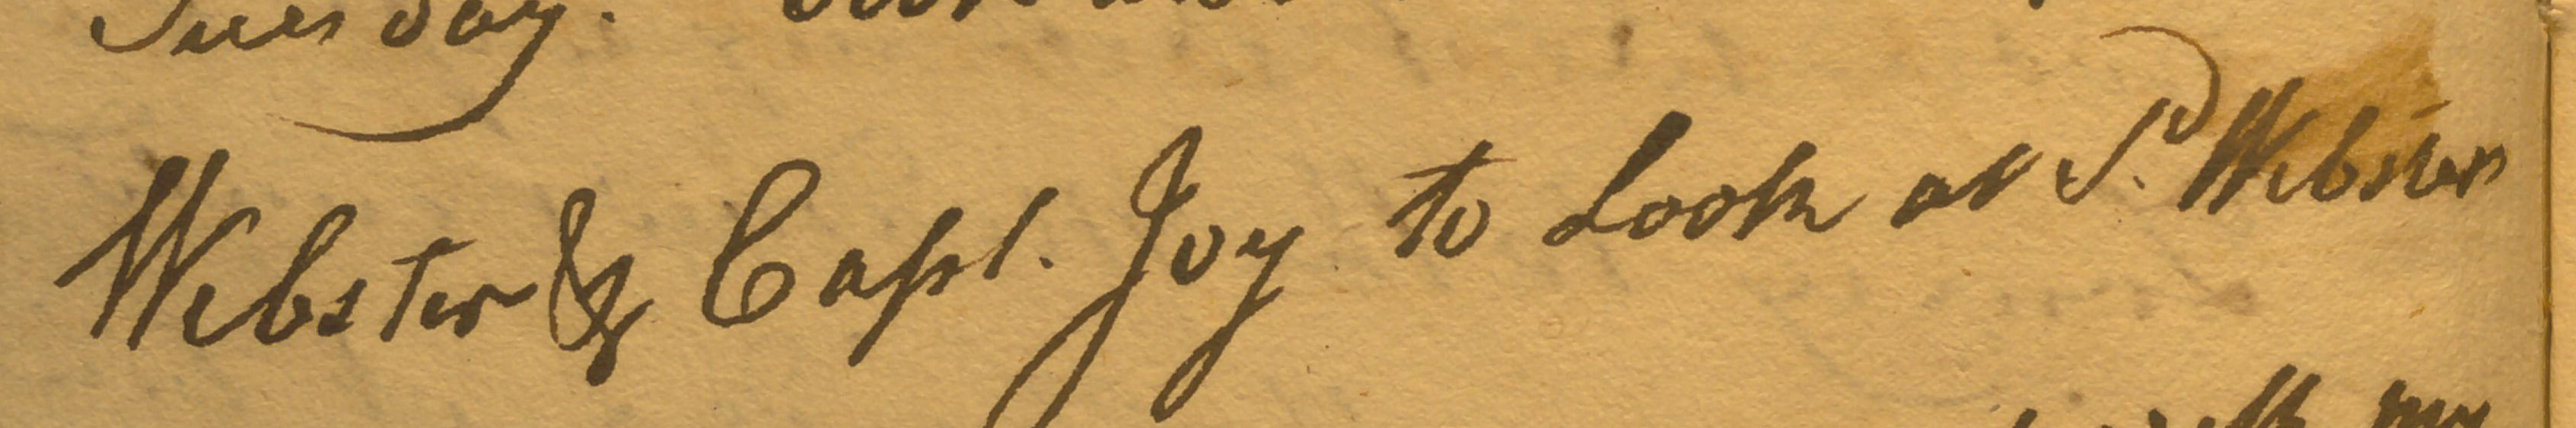Webster & Capt. Joy to Look at s^d. Websters
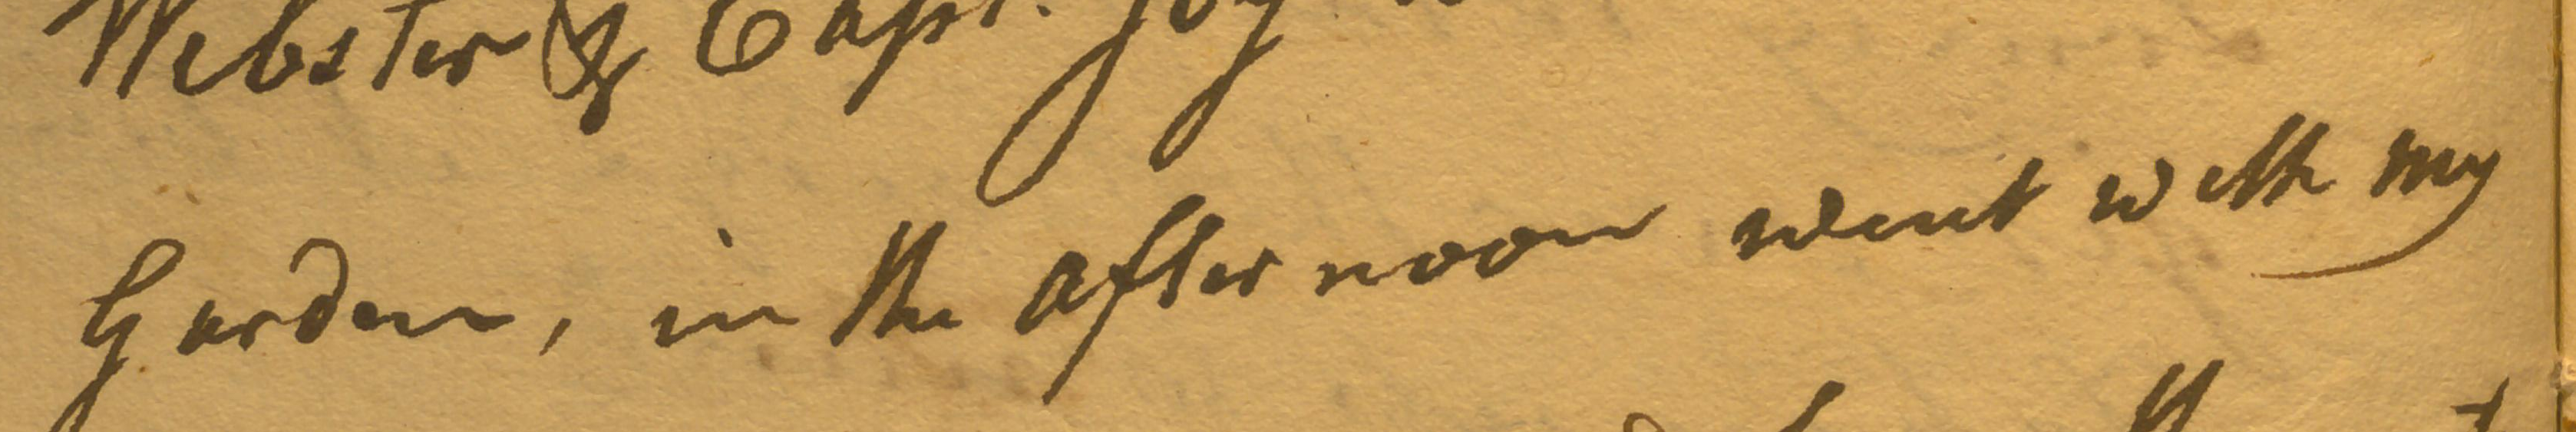Garden, in the afternoon went with my
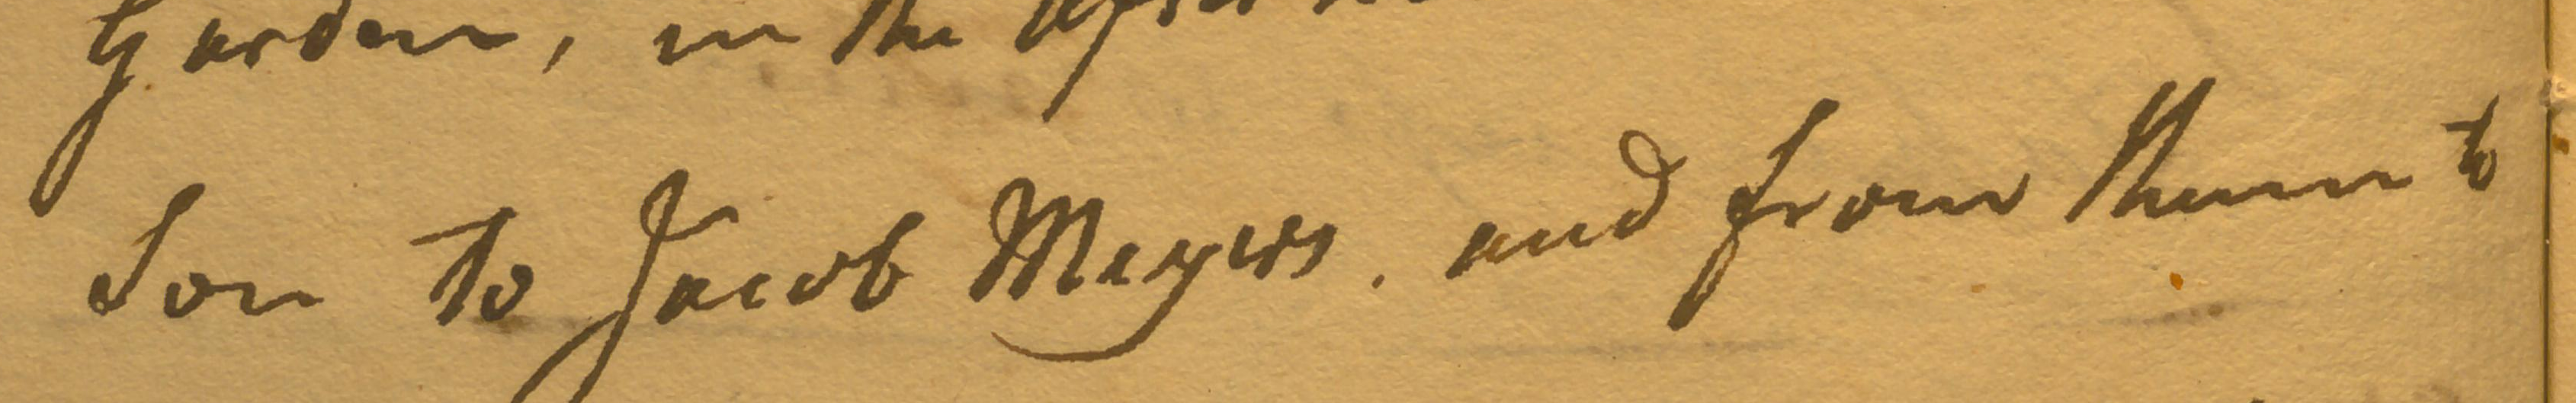Son to Jacob Meyers, and from thence to
